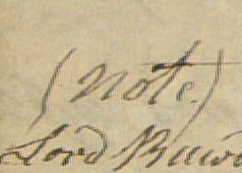(note)
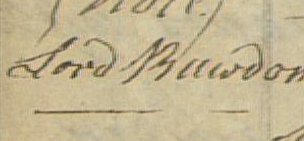Lord Rawdon
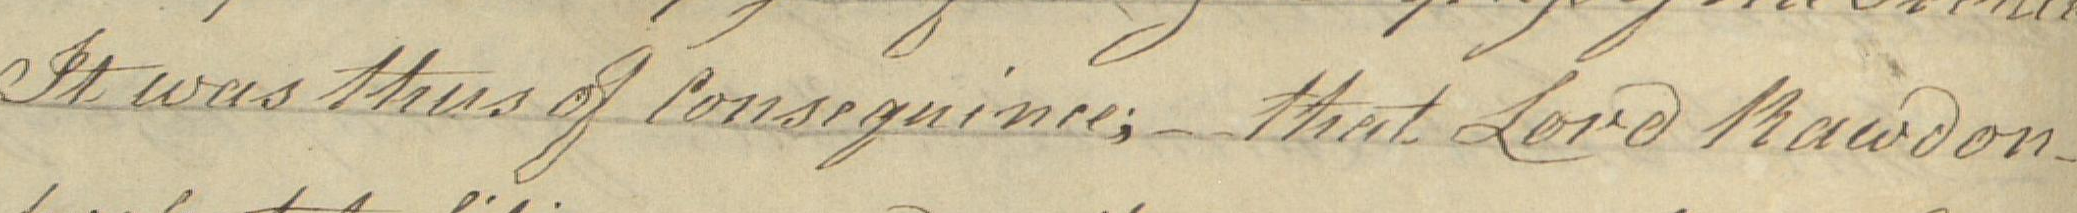It was thus of Consequince,- that Lord Rawdon
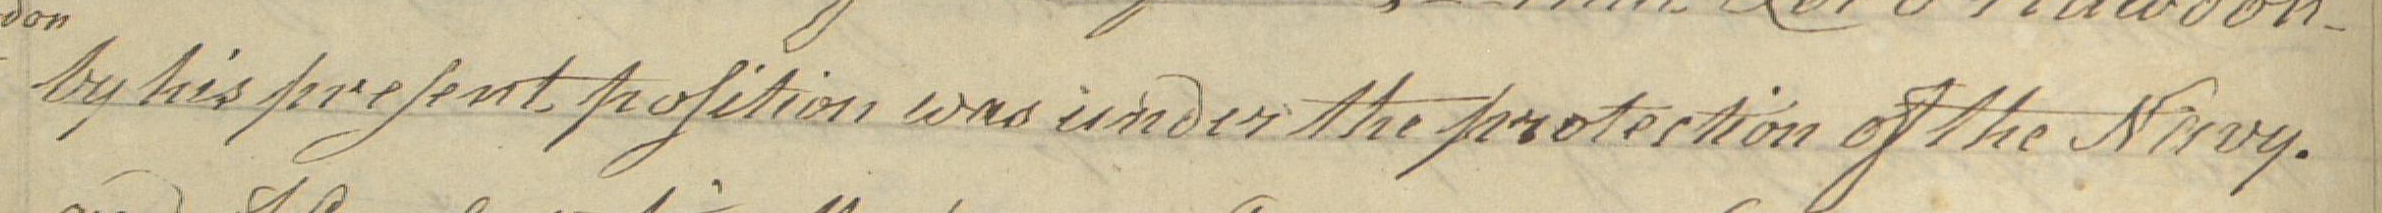by his present position was under the protection of the Navy.
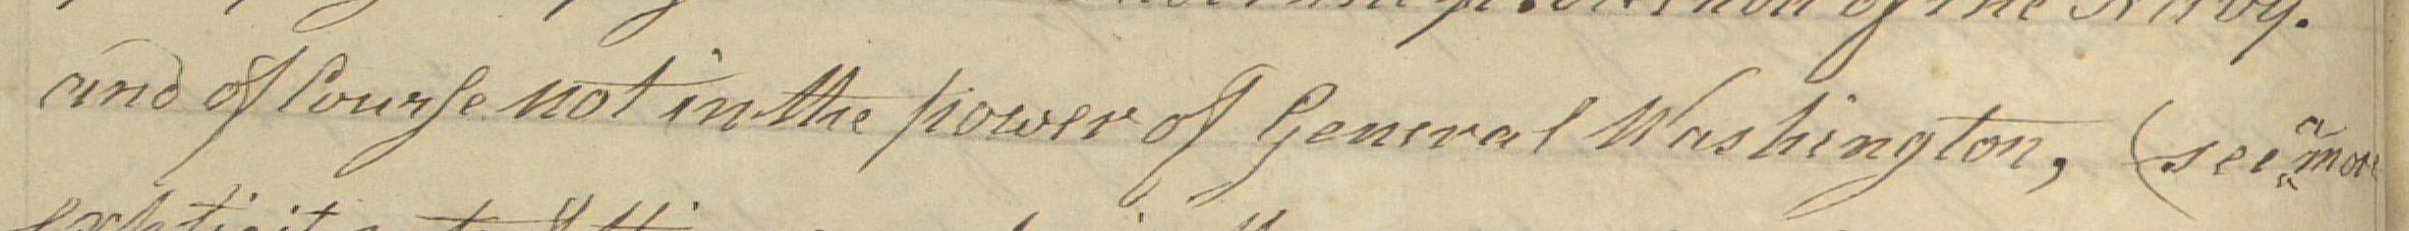and of Course not in the power of General Washington, (see ^ mor-
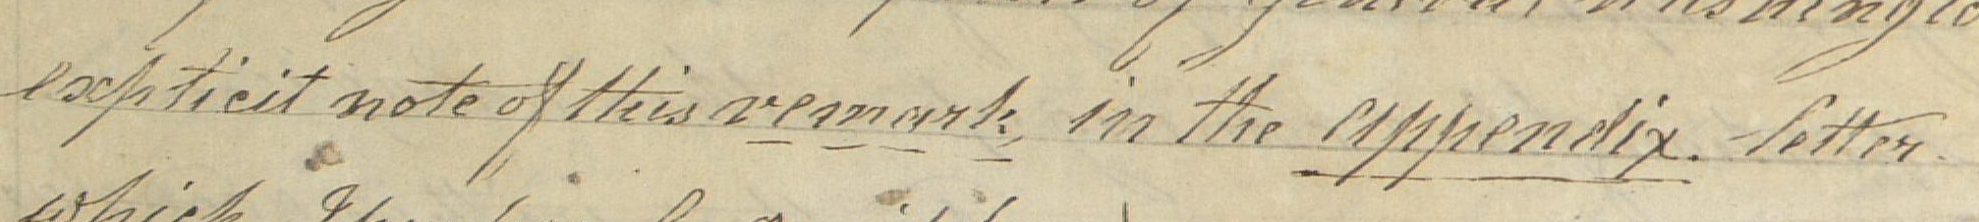expticit note of this remark in the Appendix Letter
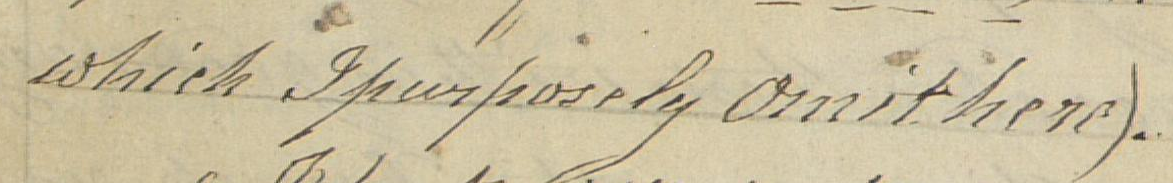which I purposely omit here).
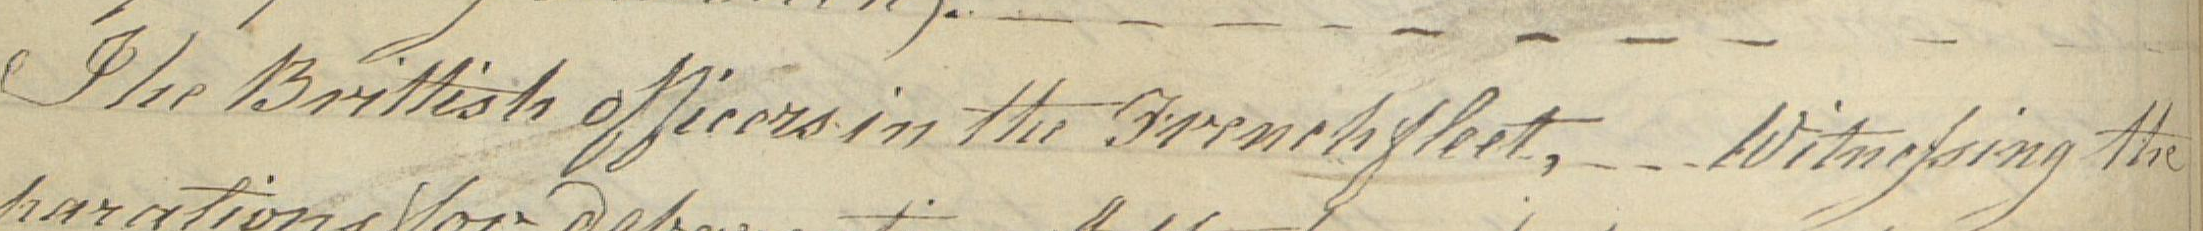The Brittish officers in the Frenchfleet, Witnessing the
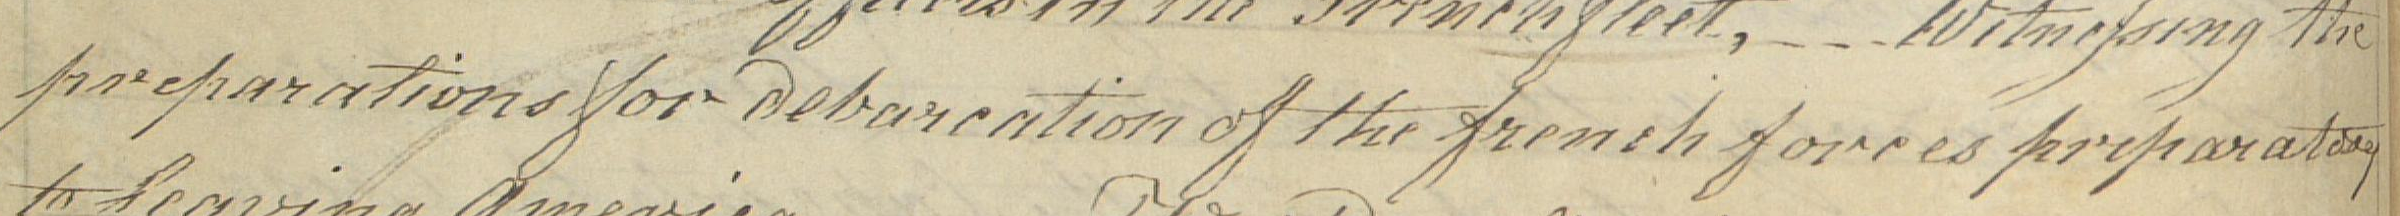preparations for debarcation of the french forces preparatory
